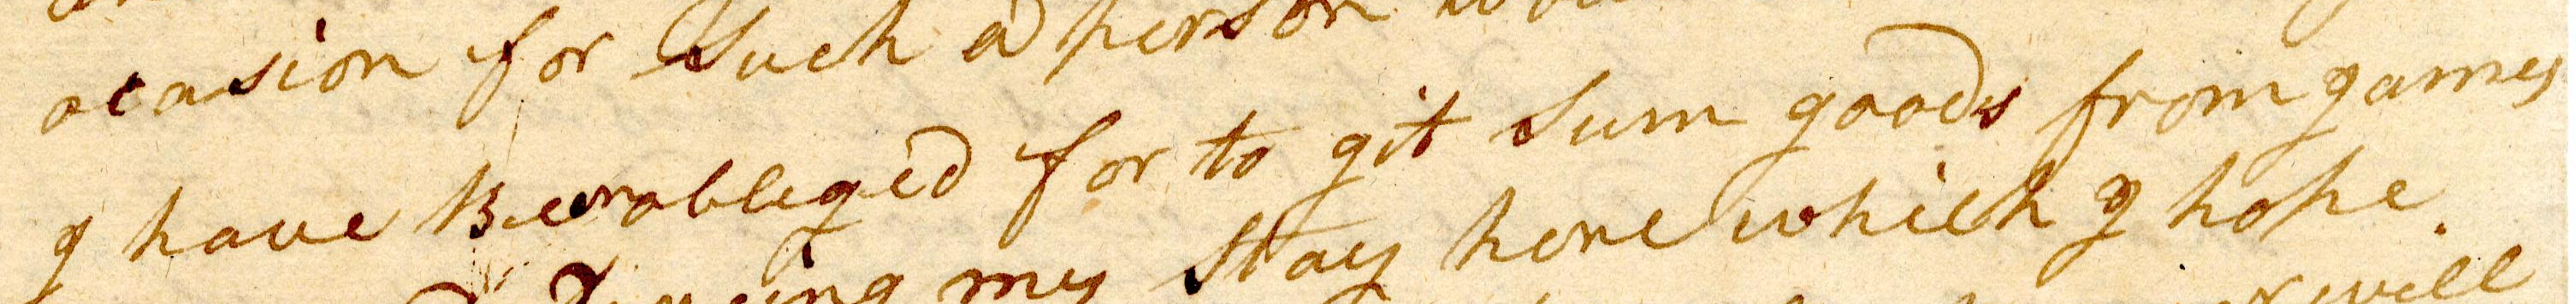I have Been obliged for to git sum goods from games
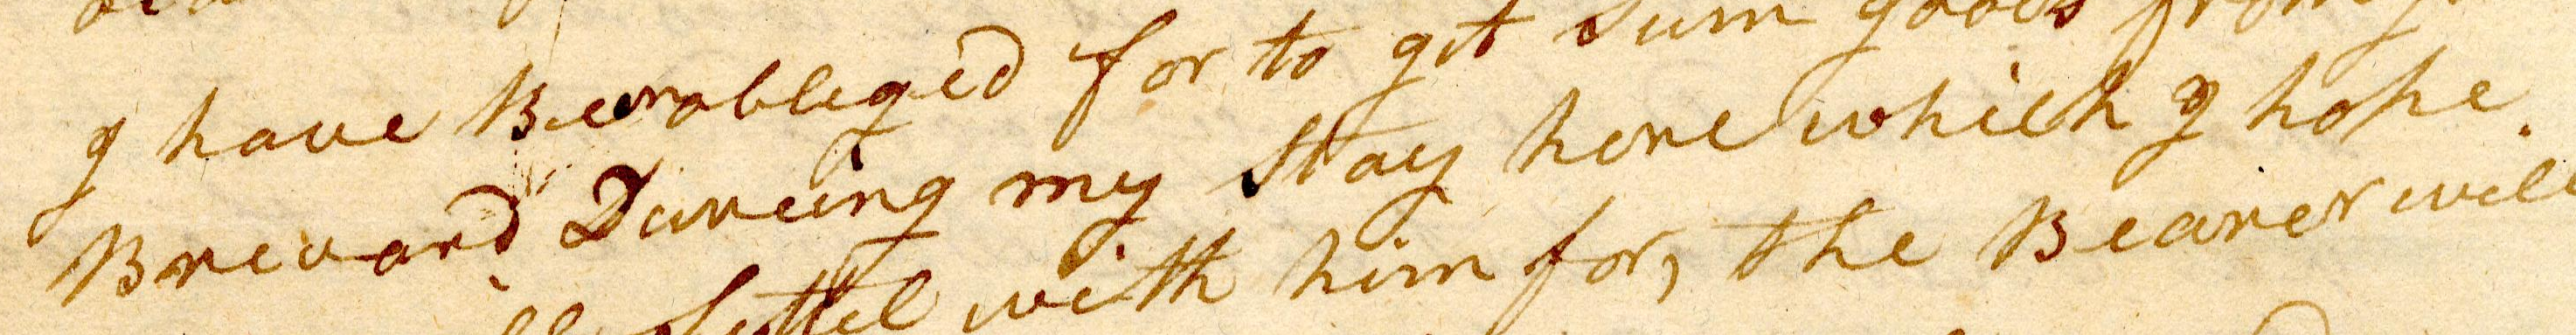Bore and Dureing my stay here which I hope
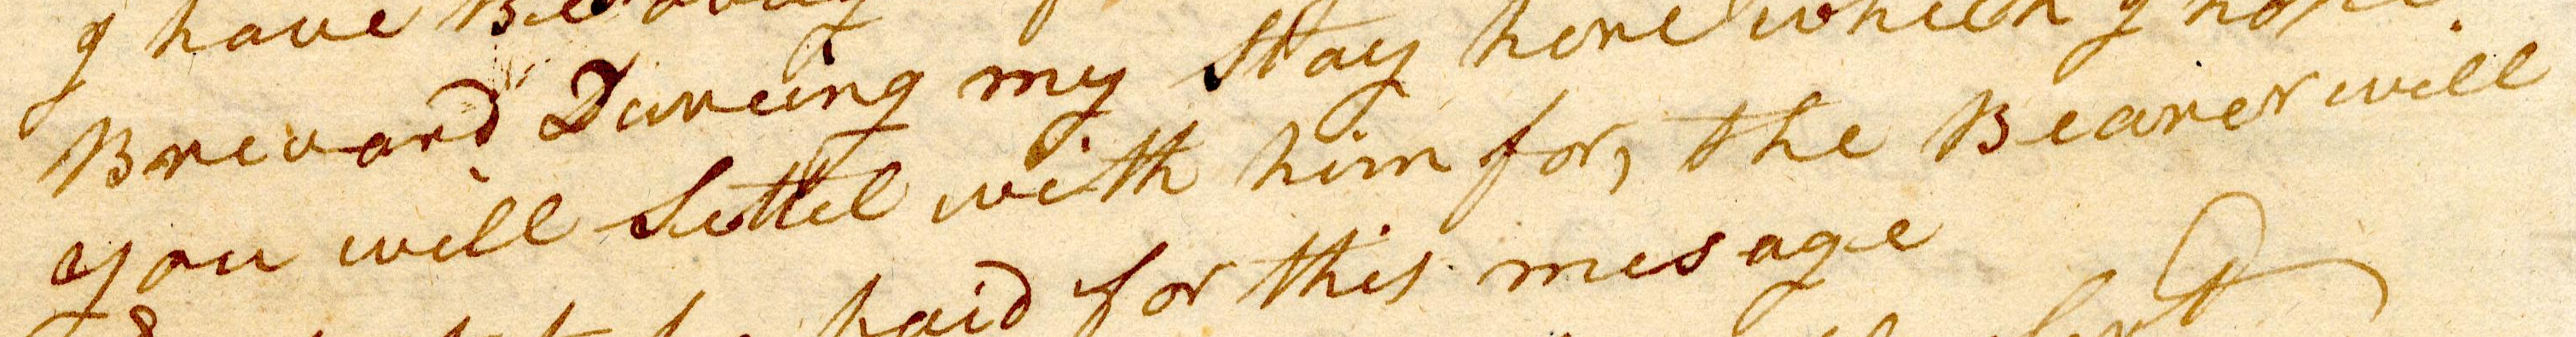you will settel with him for, the Bearer will
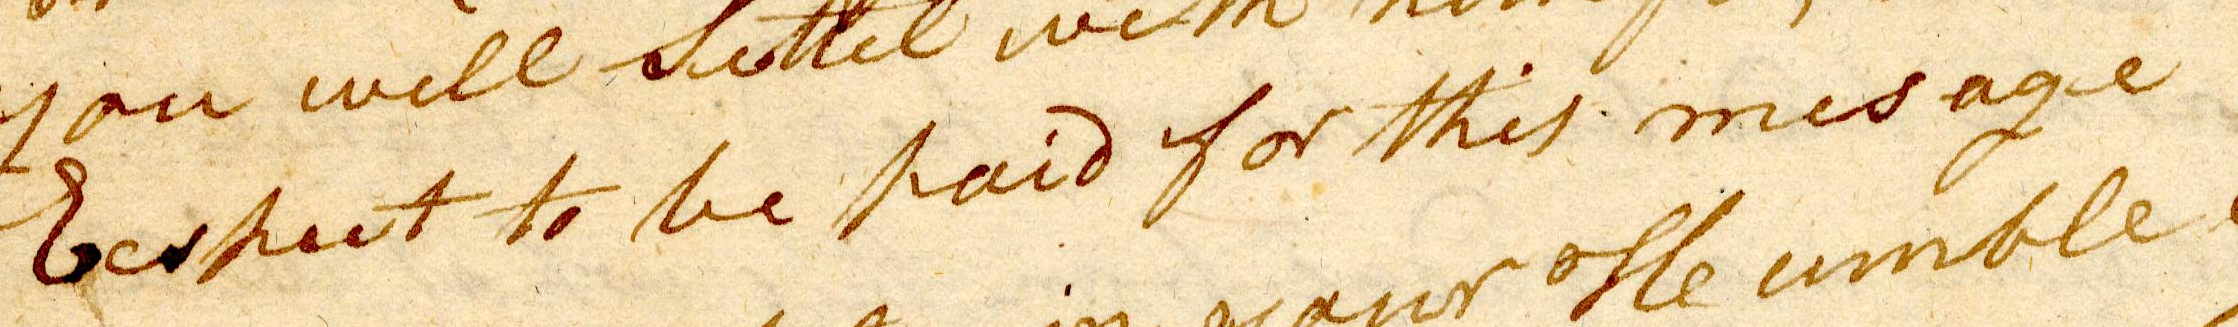Ecspct to be paid for this mesage
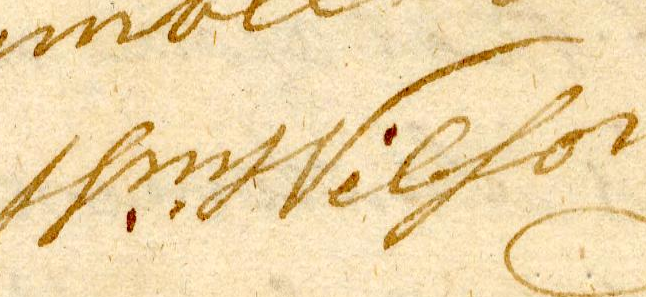W^m. Wilson
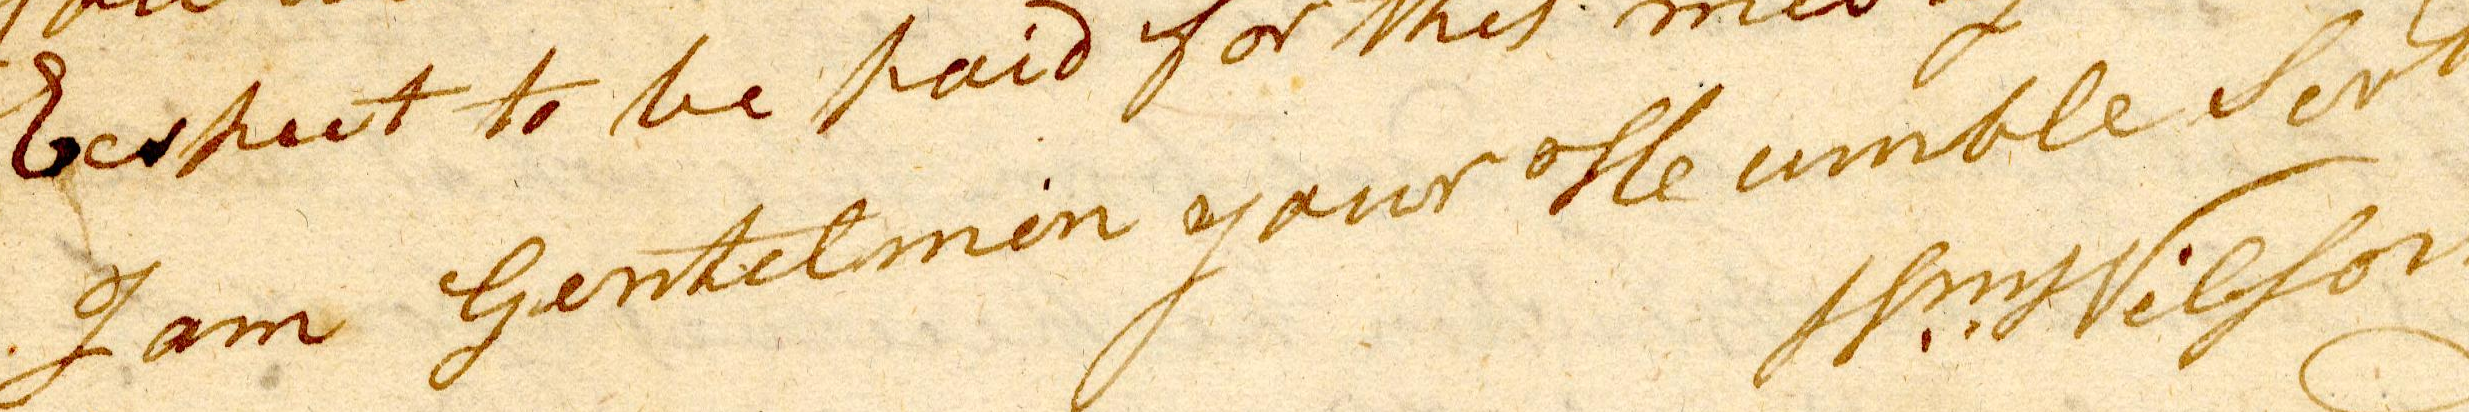I am Gentelmen your Humble Ser^t
